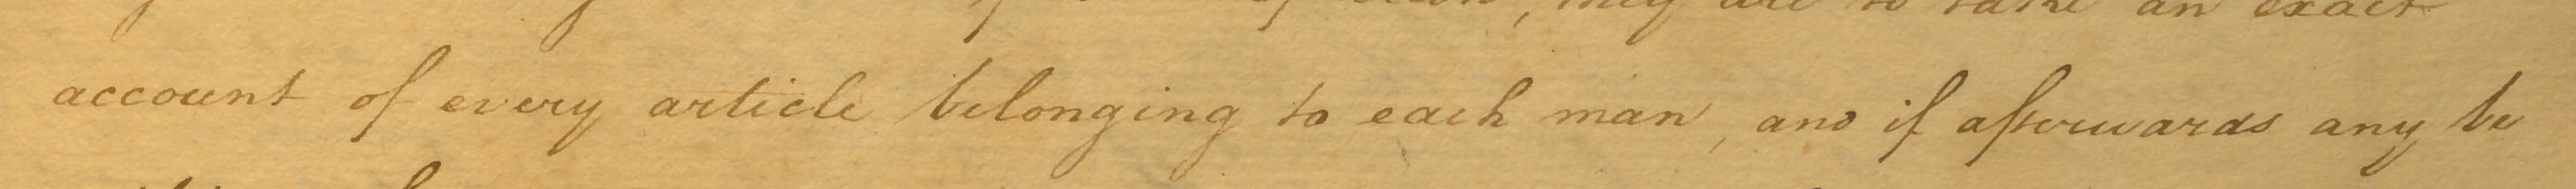account of every article belonging to each man and if afterwards any be
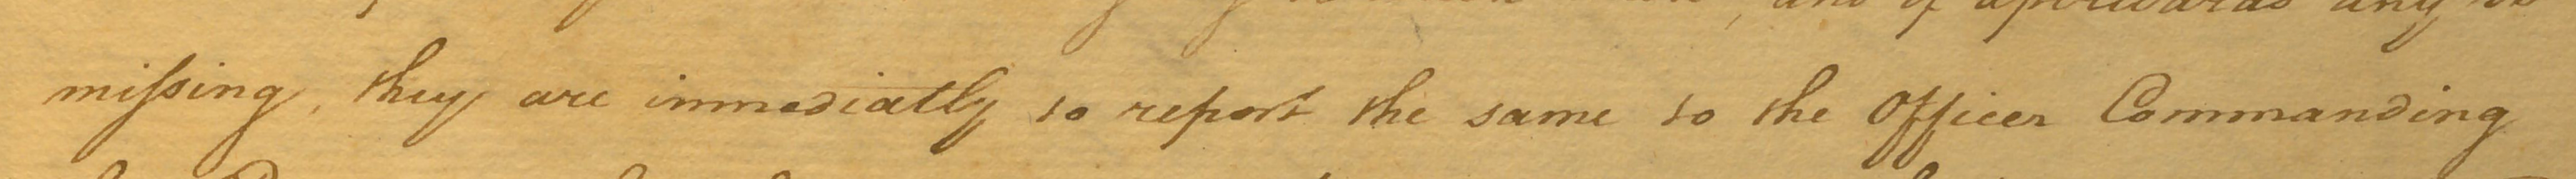missing, they are immediately to report the same to the Officer Commanding
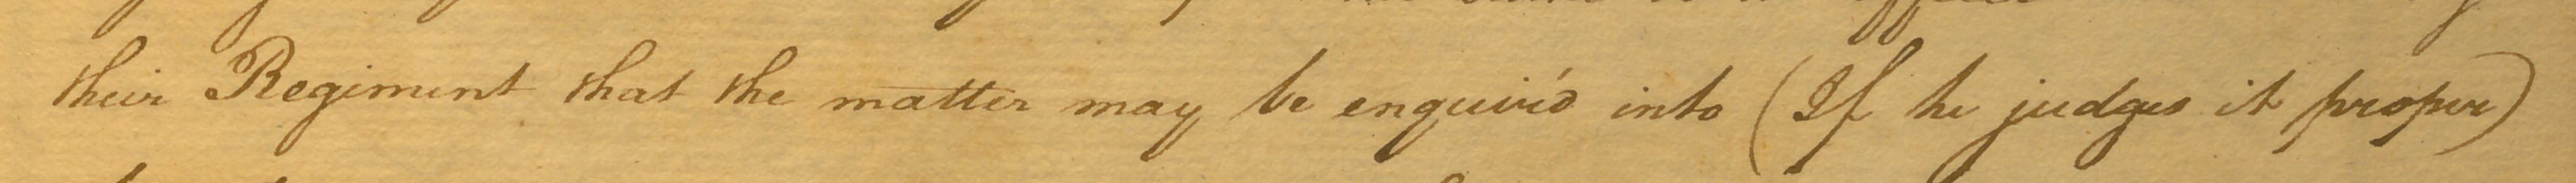their Regiment that the matter may be enquir'd into (If he judges it proper)
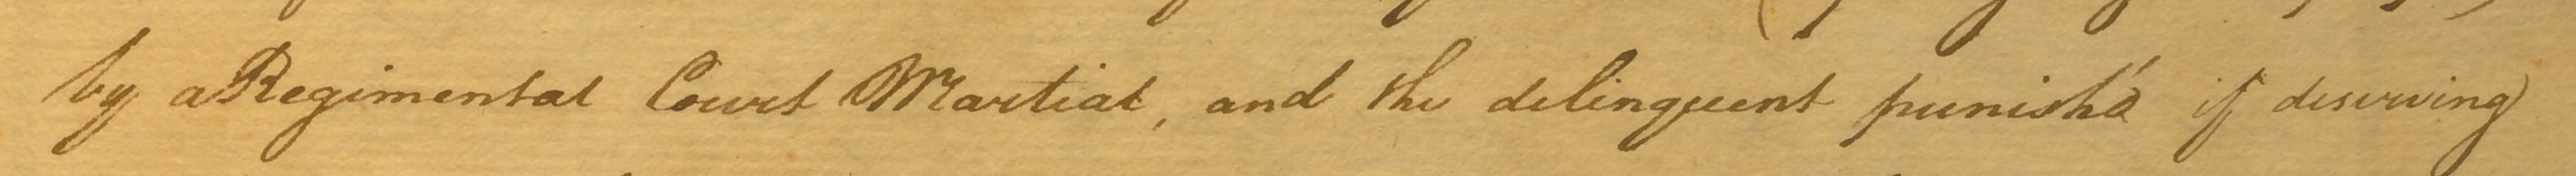by a Regimental Court Martial, and the delinquent punish'd if deserving
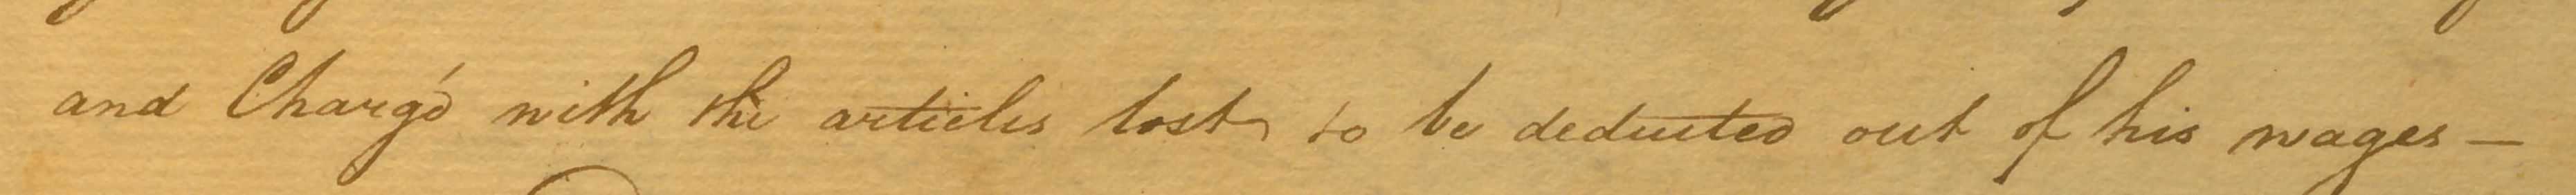and Charg'd with the articles lost to be deducted out of his wages-
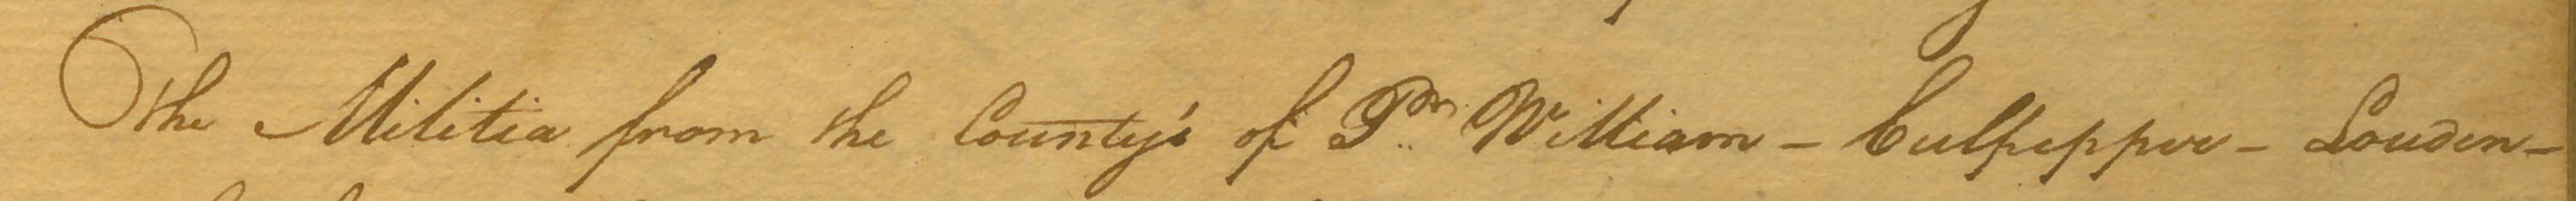The Militia from the County's of P^r. William- Culpepper- Loudon-
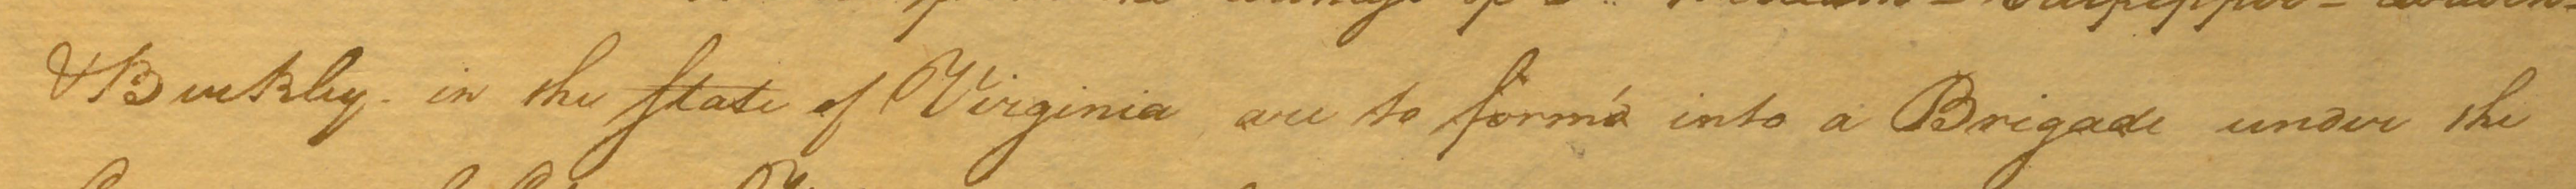& Buckley in the State of Virginia are so form'd into a Brigade under the
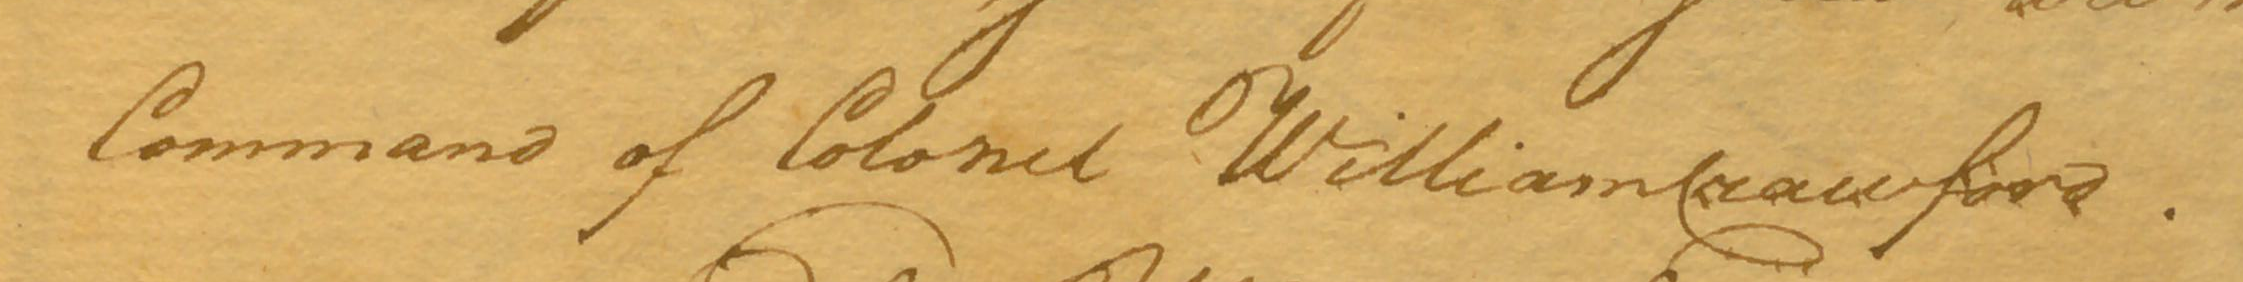Command of Colonel William Crawford.
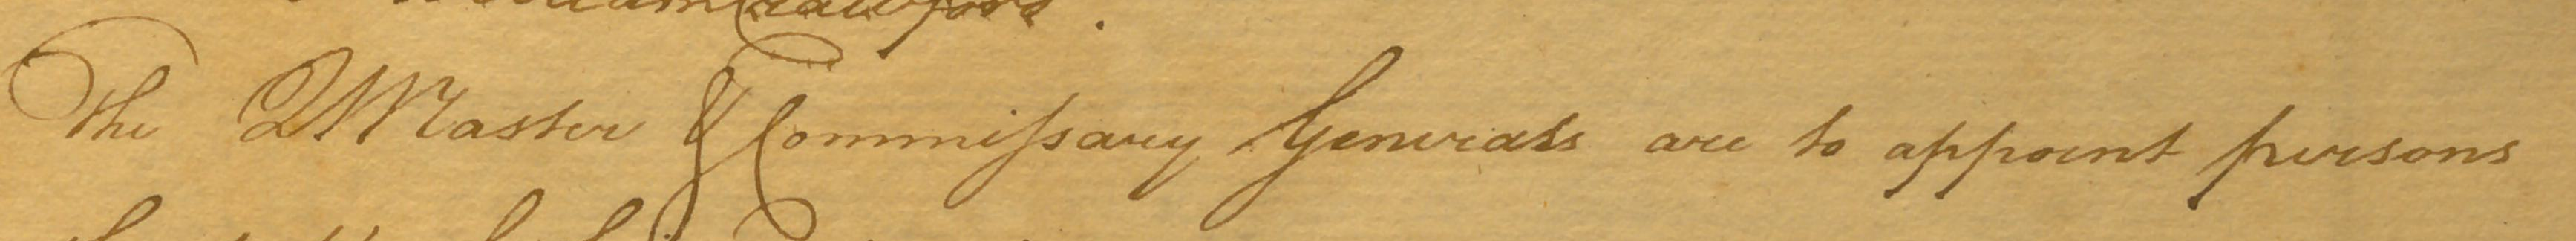The QMaster & Commissary Generals are to appoint persons
